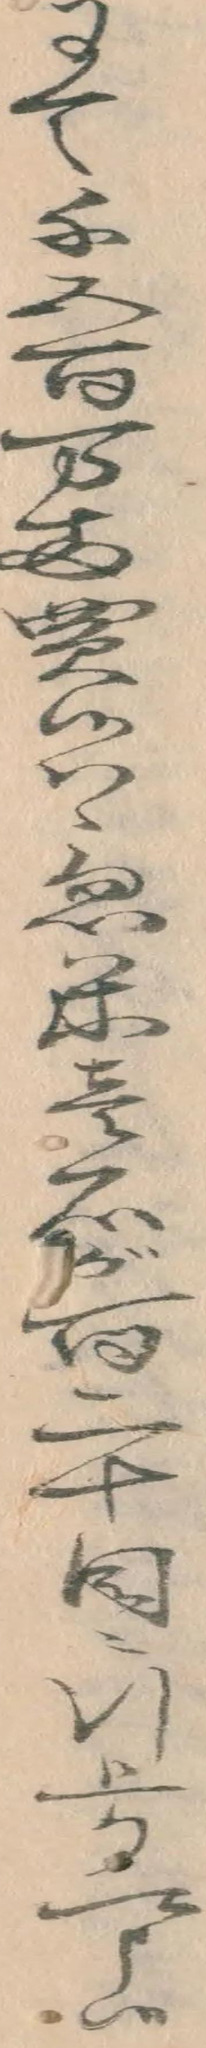にて千五百万両買候はゝ忽米壱石が百二十目に引上り可申候
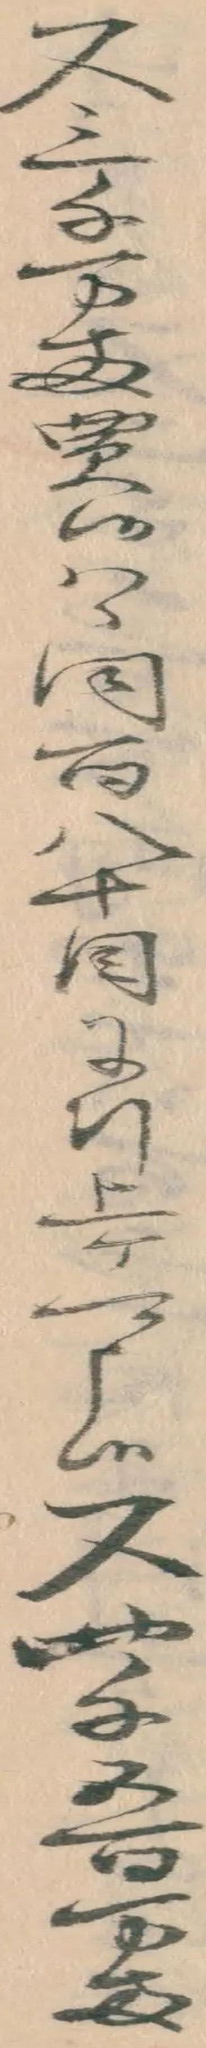又三千万両買候はゝ同百八十目に引上け可申候又四千五百万両
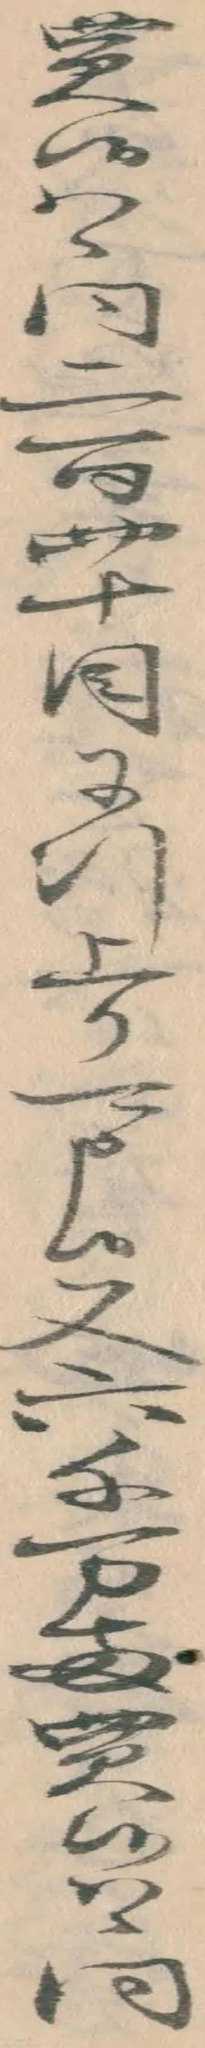買候はゝ同二百四十目に引上り可申候又六千万両買候はゝ同
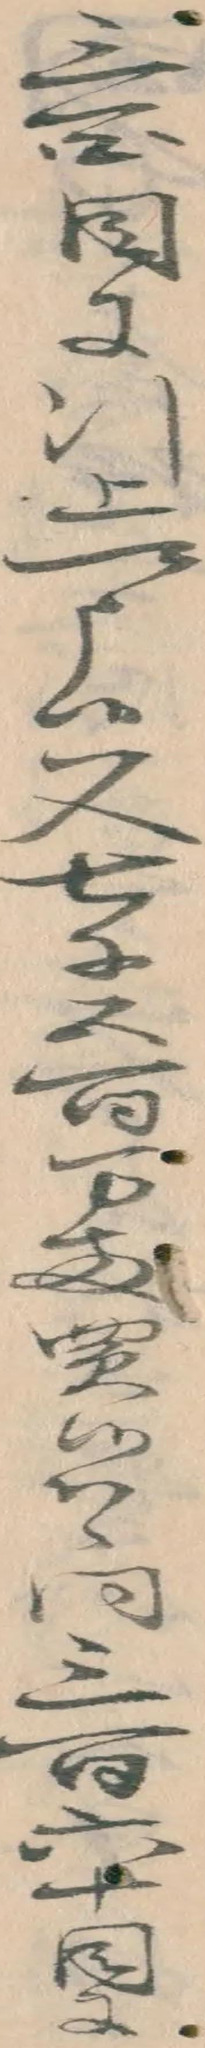三百目に引上可申候又七千五百万両買候はゝ同三百六十目に
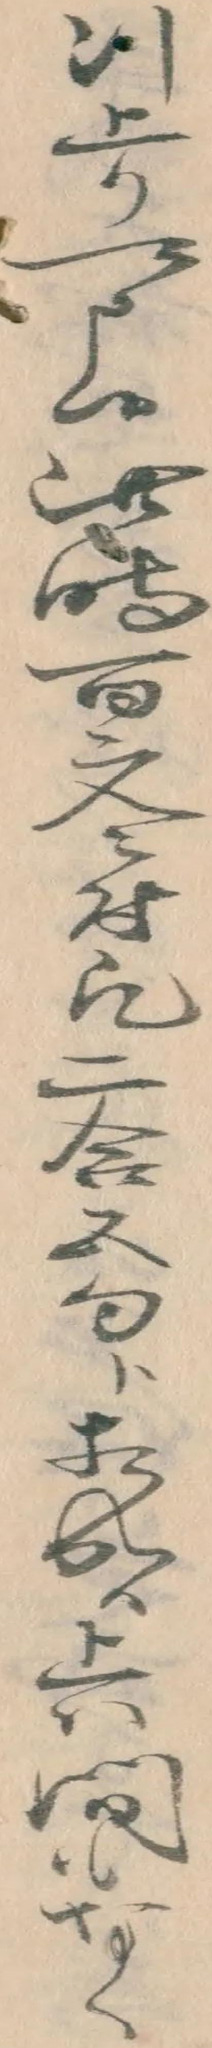引上り可申候此時百文に付凡二合五勺と相成候上は間もなく
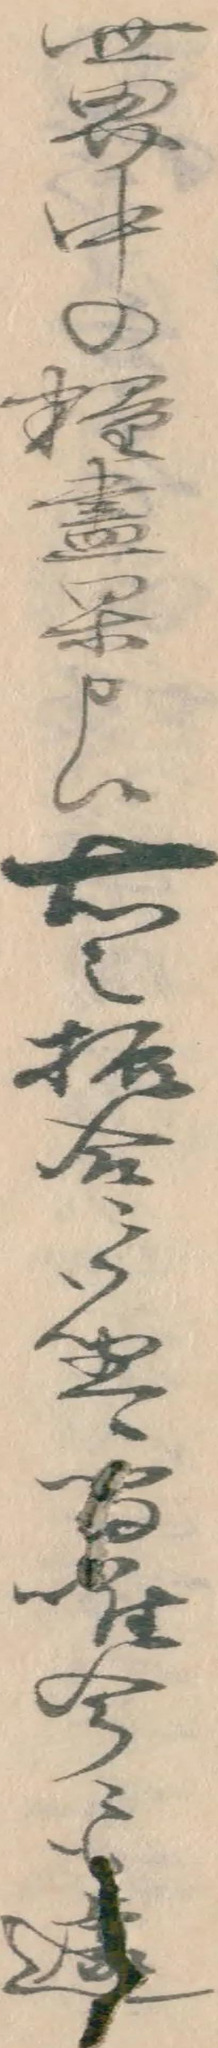世界中の糧尽果申候右之振合に御坐候間唯今にも遽
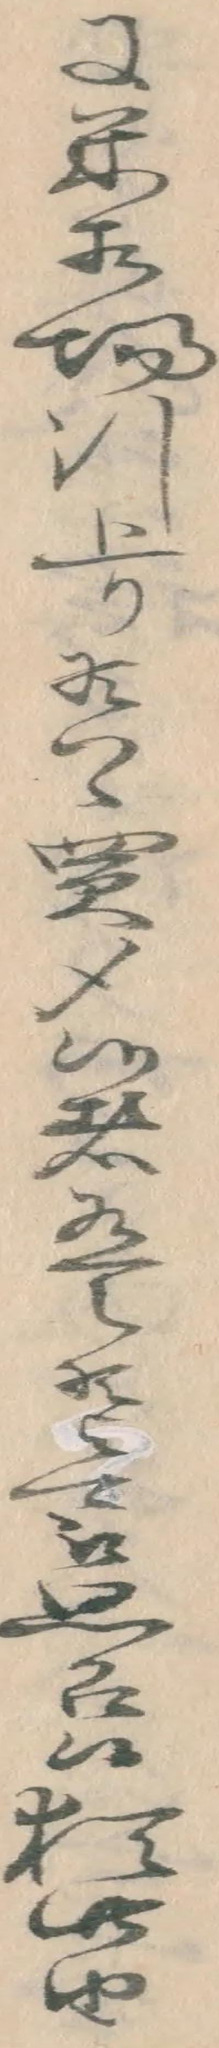に米相場引上り候はゝ買〆候者有之候と可被思召候猶此由
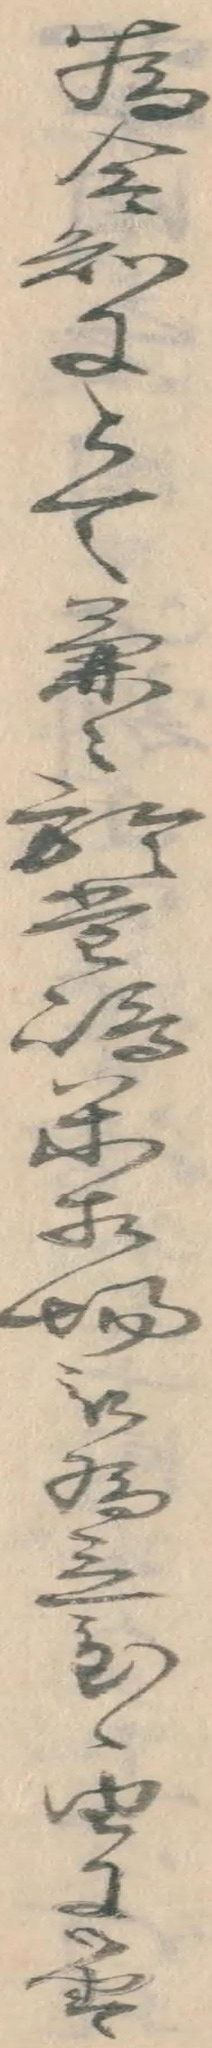為令知にとて兼々於堂島米相場被為立至候由に御坐候
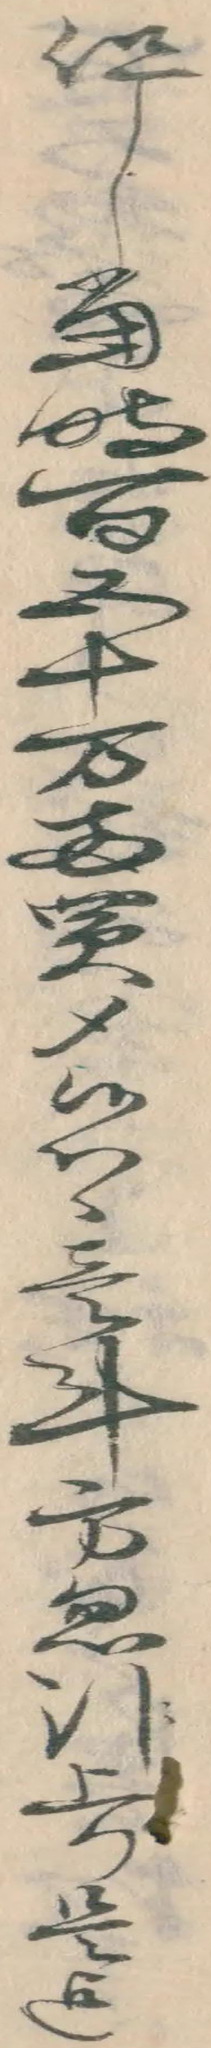但し当時百五十万両買〆候はゝ壱斗方忽引上り是迄
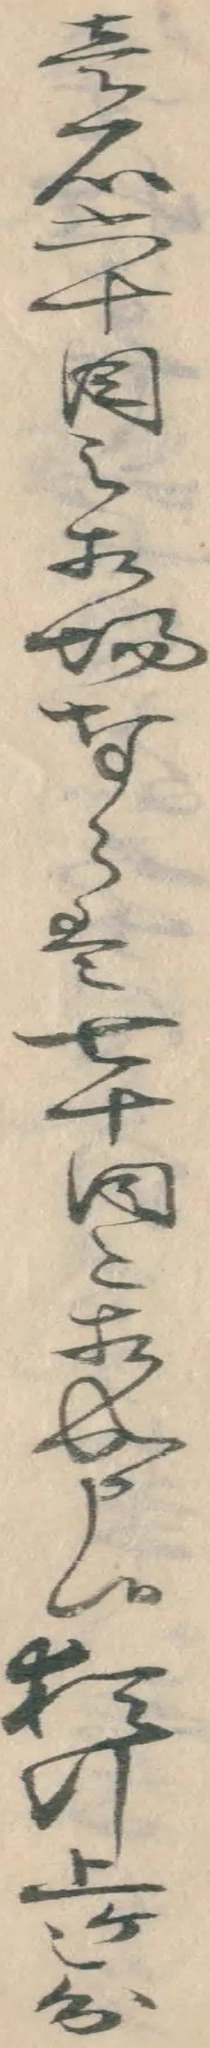壱石六十目之相場ならは七十目と相成申候猶引上け之分
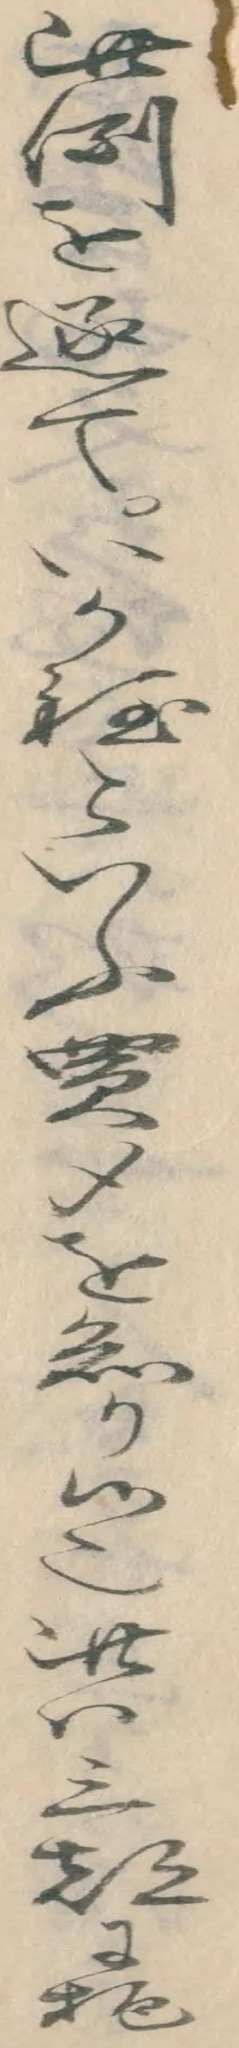此例を逐て°いか程といふ買〆を知り候也此は三都に抱
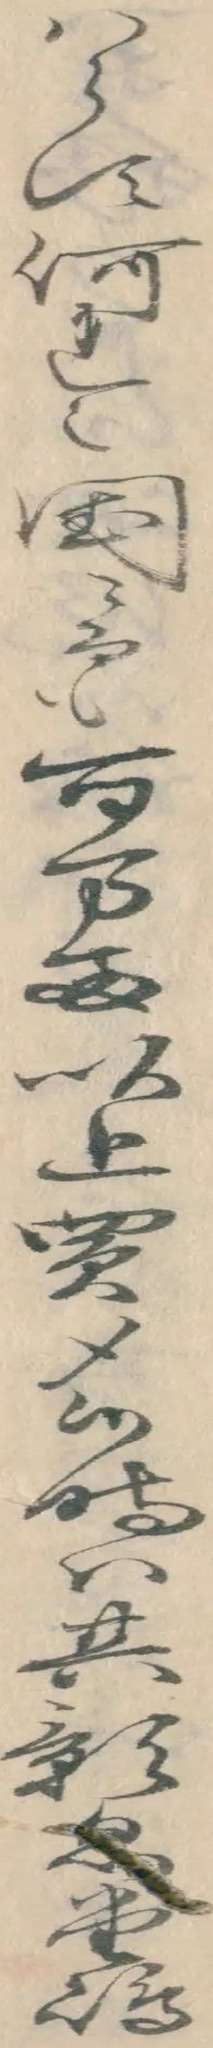はらす何れ之国に而も百万両以上買〆候時は其影忽堂島

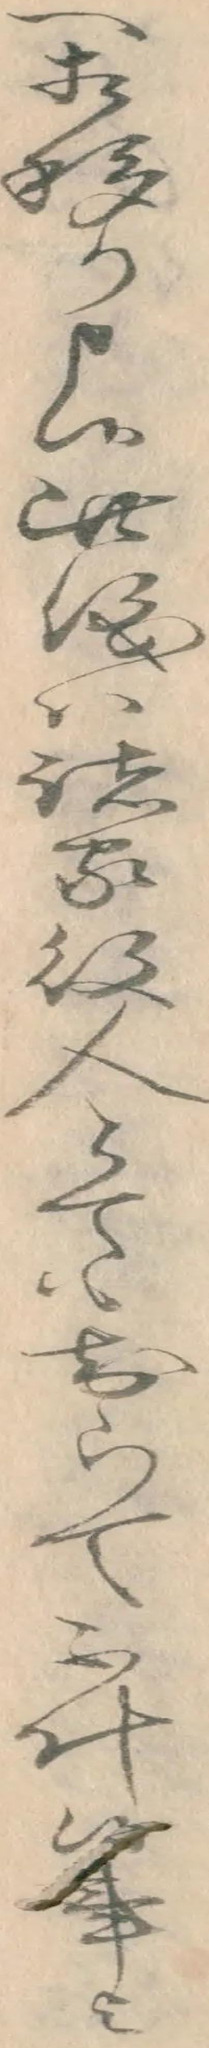へ相移り申候此儀は諸家役人とても知らて不叶候事と
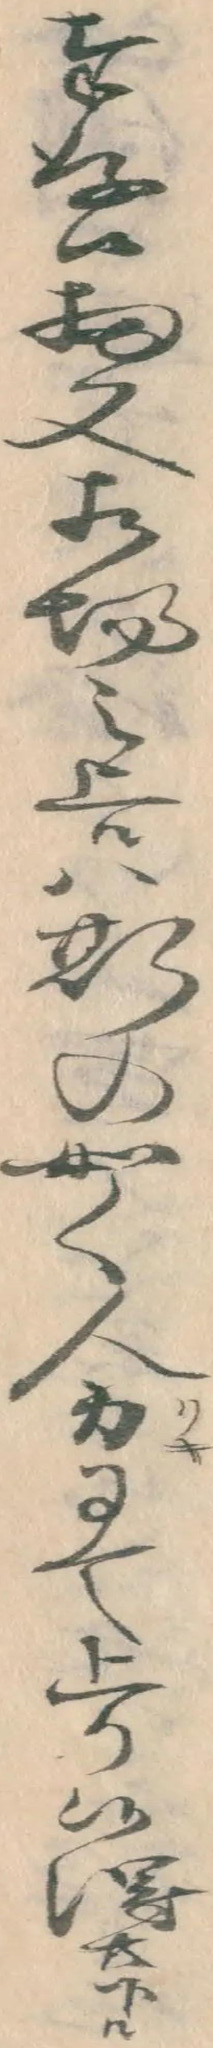奉存候扨又相場之上るは斯の如く人力にて上り候得共下る
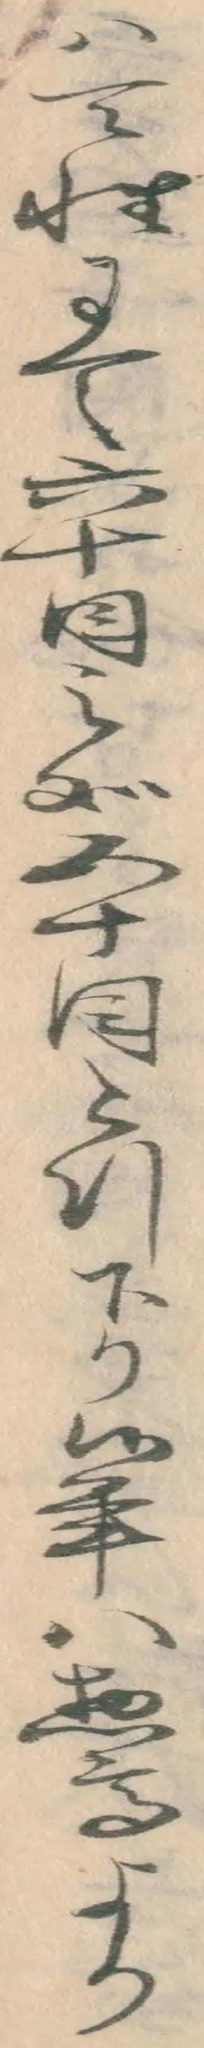は天性にて六十目之処五十目と引下り候年は惣高より
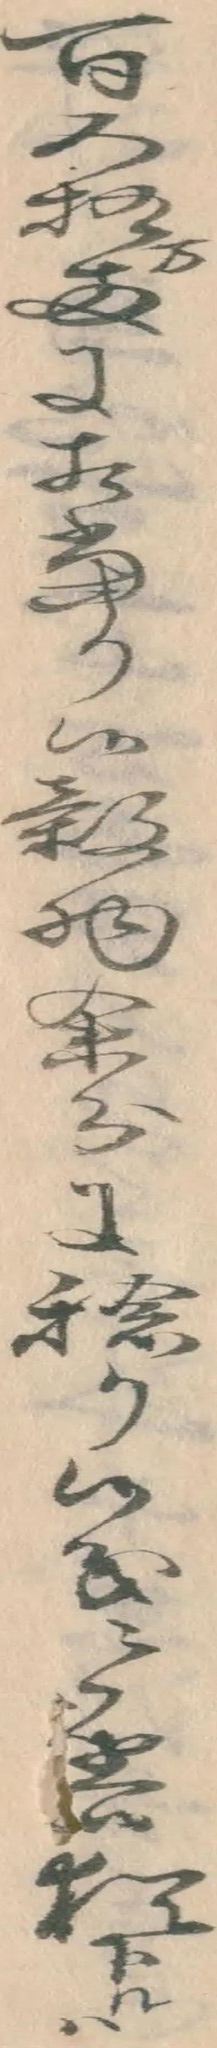百五拾万両に相当り候穀物余分に稔り候義に御座候猶下るは
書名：斎庭之穂
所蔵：国立国会図書館 National Diet Library, JAPAN
